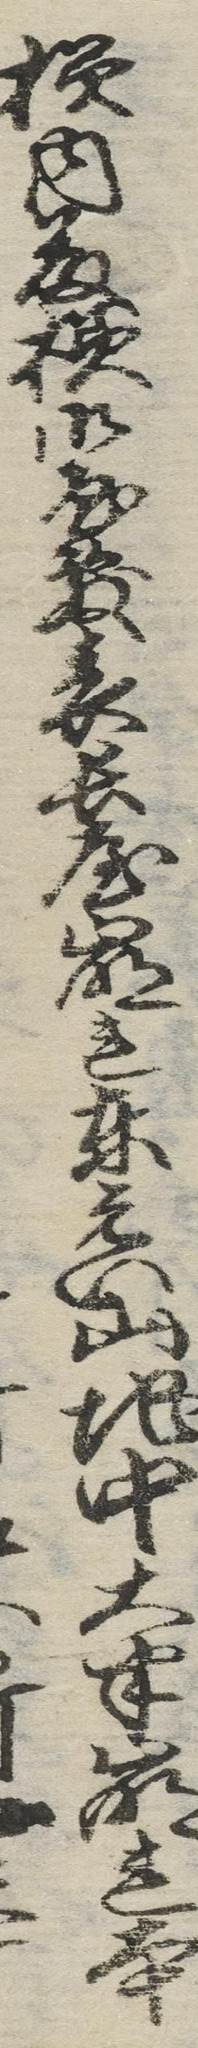様内藤様御屋敷表長屋崩れ東はい山地中大半崩れ本
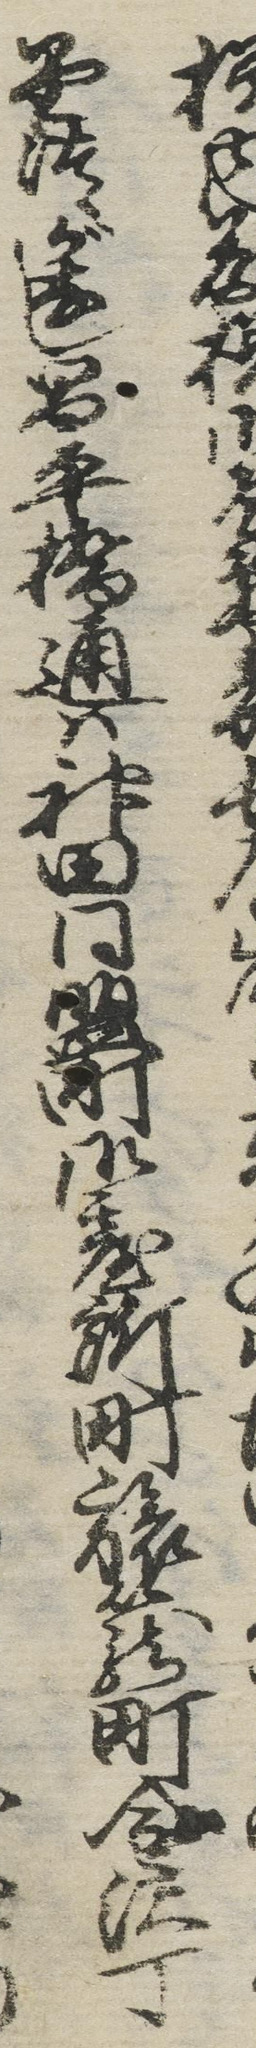堂つゝがなし昌平橋通ハ神田同盟町御台所町旅籠町金沢丁
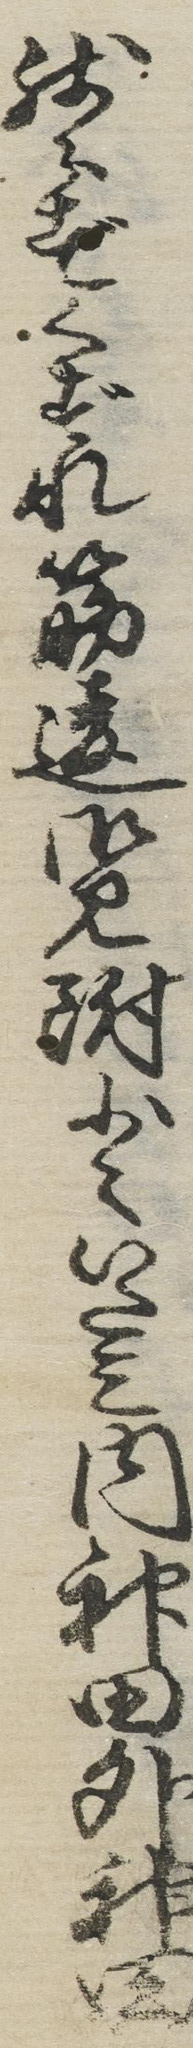残らずくずれ筋違御見附少々いたミ内神田外神田

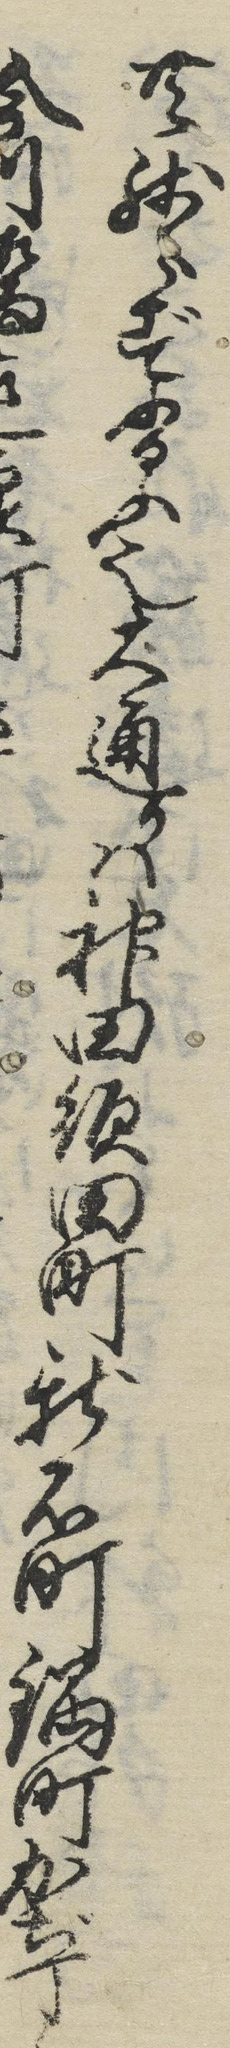共残らずふるふ也大通りハ神田須田町新ほ町鍋町かぢ丁
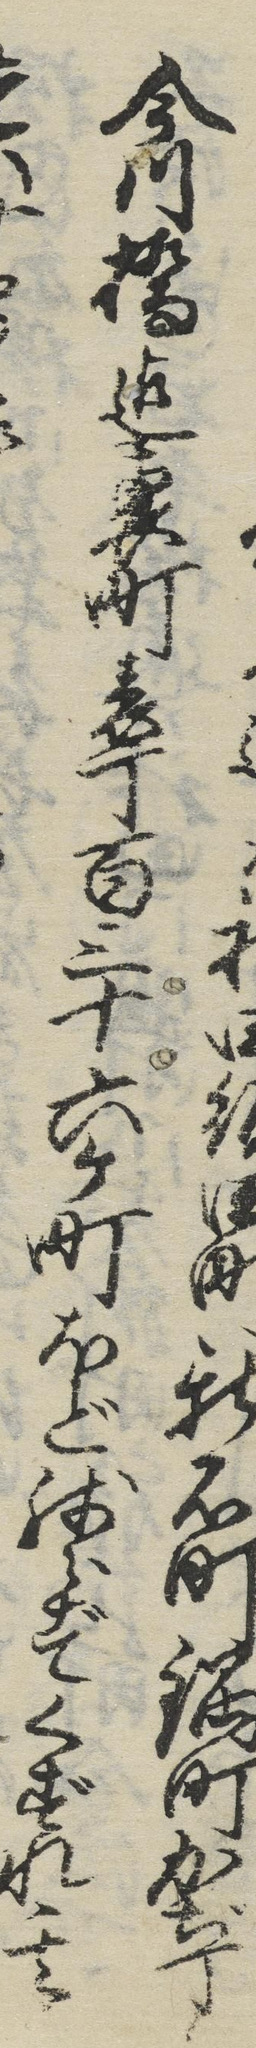今川橋迄裏町表丁百三十六ヶ町ほど残らずくずれ其
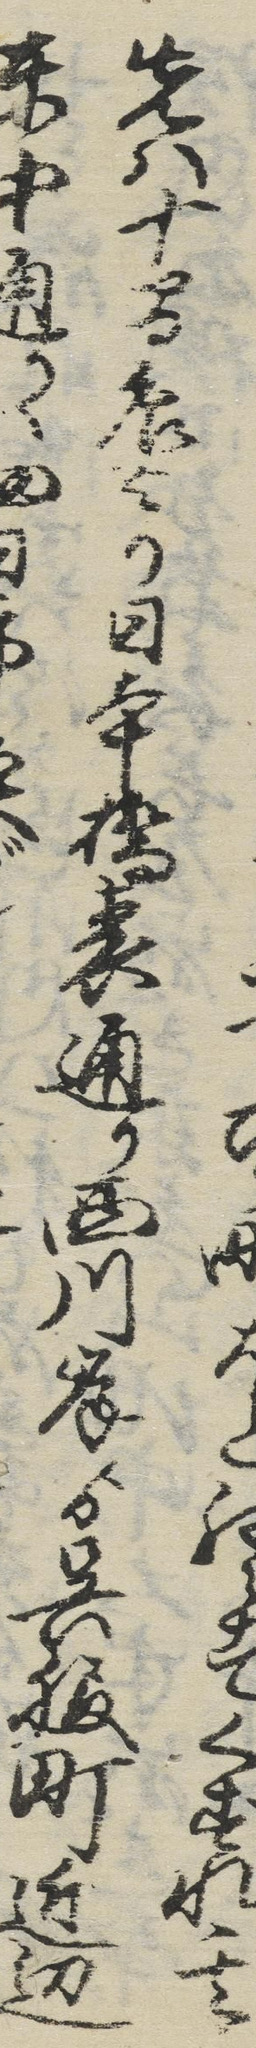先ハ十間より日本橋裏通り西川岸ゟ呉服町近辺
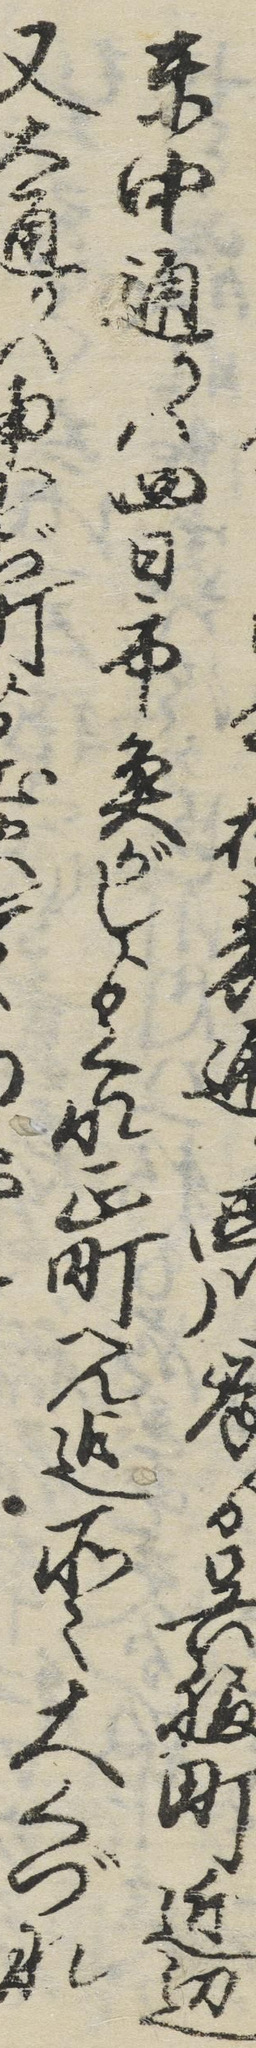東中通りハ四日市魚がしゟくれ正町へん迄所々大くづれ
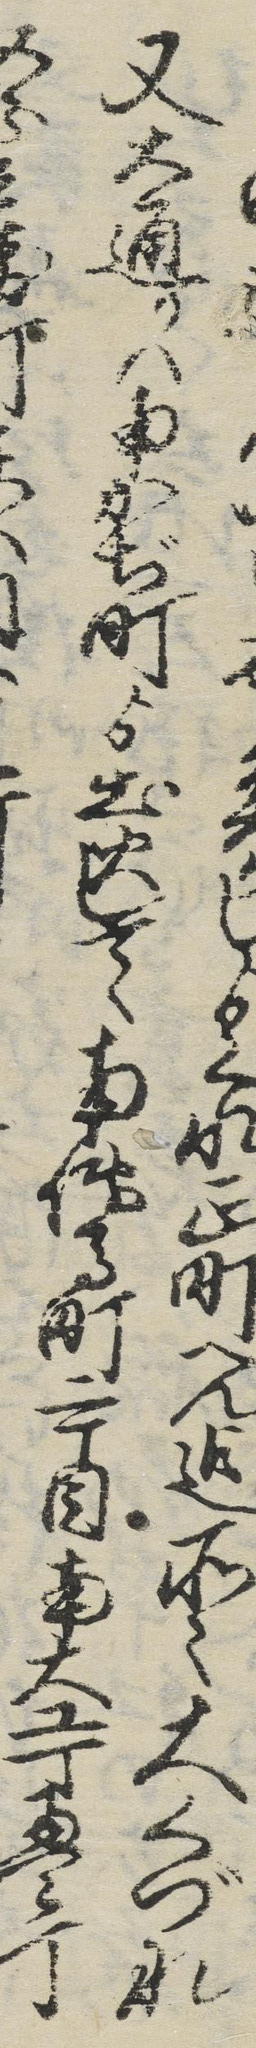又大通りハ南かぢ町ゟ出火して南伝馬町二丁目南大工丁畳丁
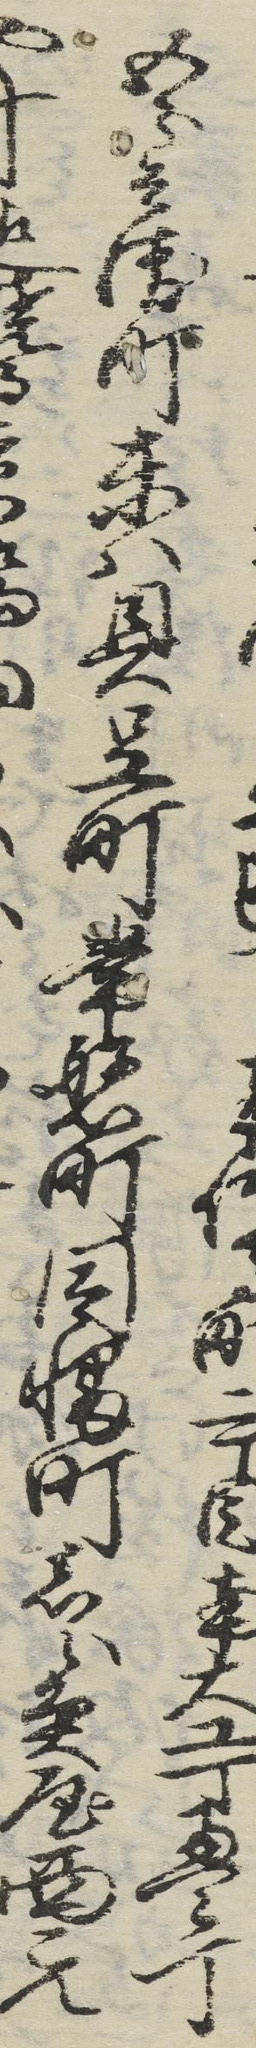五郎兵衛町東ハ具足町常盤町因幡町しら魚屋西こん
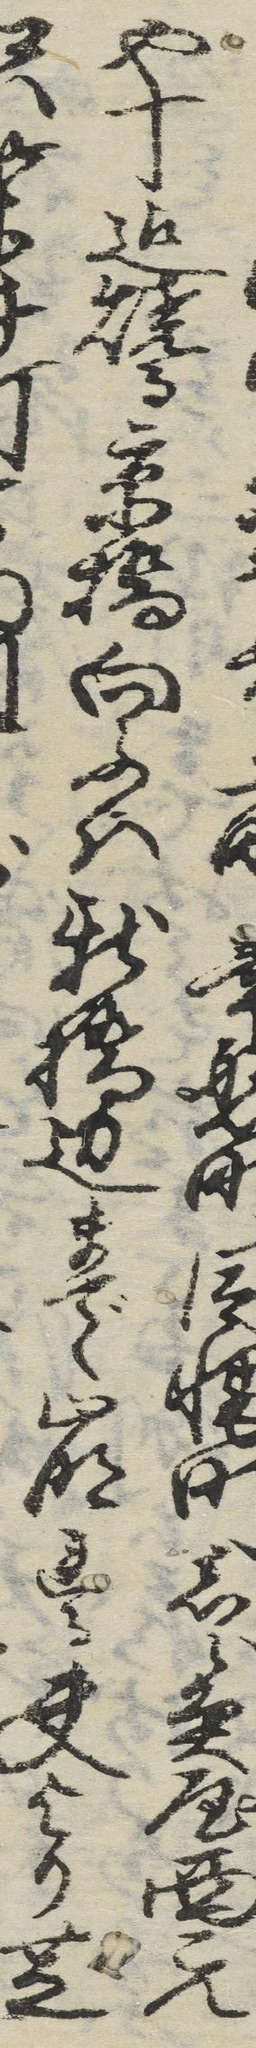や丁迄焼る京橋向ふハ新橋辺まで崩れる夫より芝
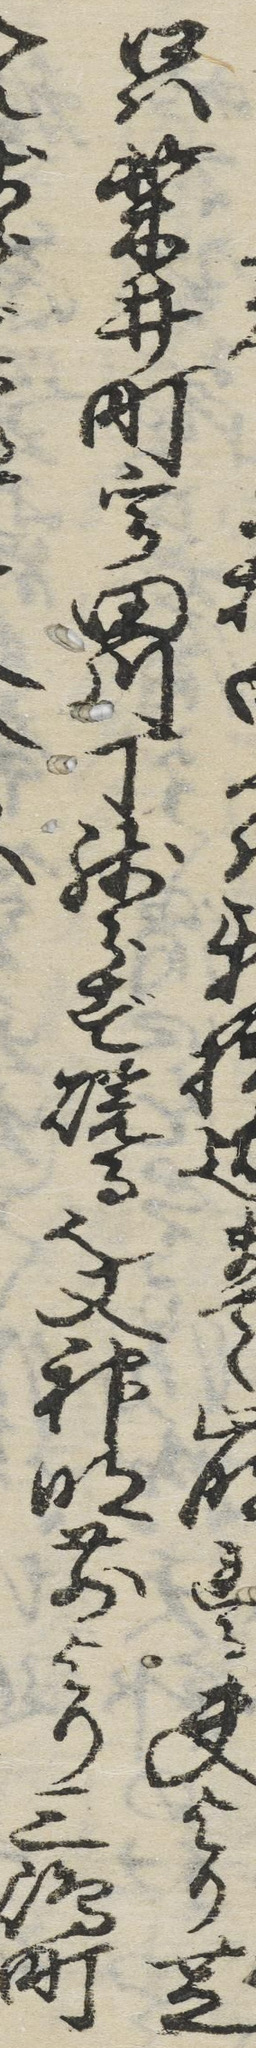口ハ柴井町宇田川丁残らず焼る也又神明前より三嶋町
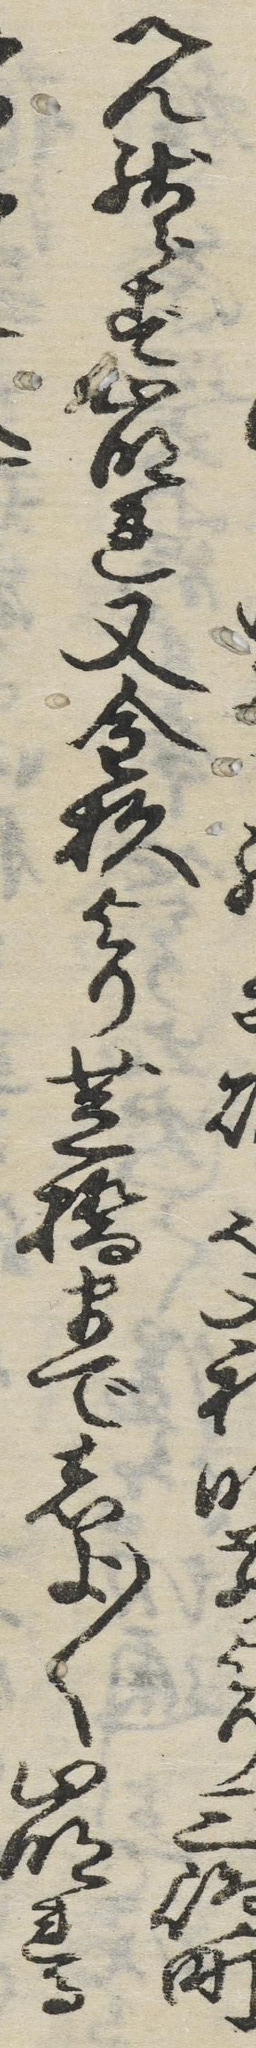へん残らず崩れ又金杉より芝橋までしよ〳〵崩れる
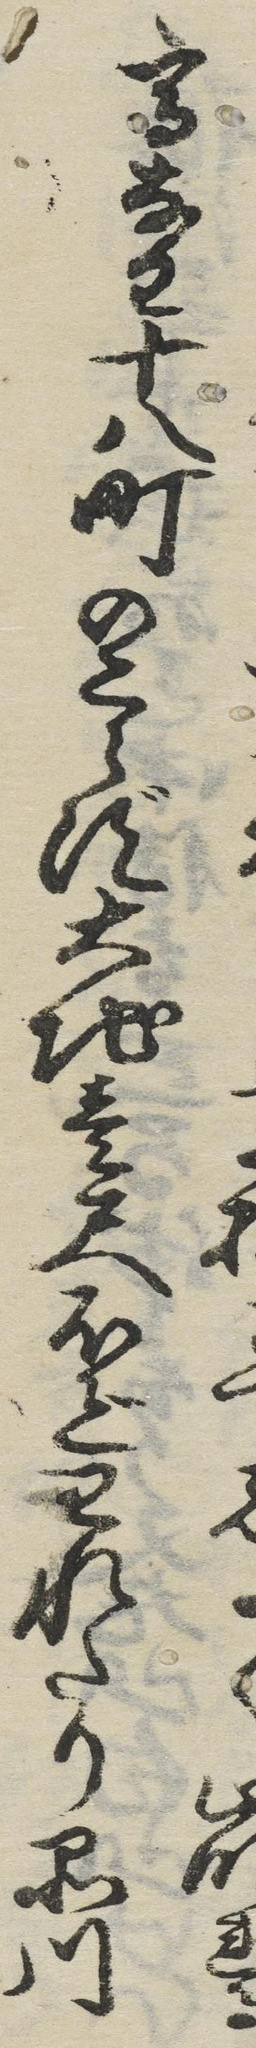高なわ十八町のこらず大地壱尺ほどわれたり品川
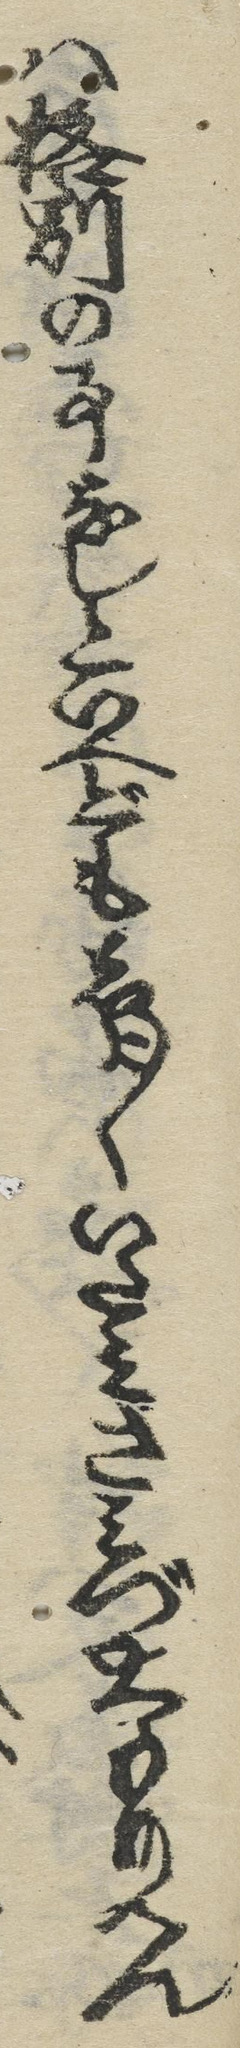ハ格別の事なしといへどもしよ〳〵いたミさみづ大手のへん
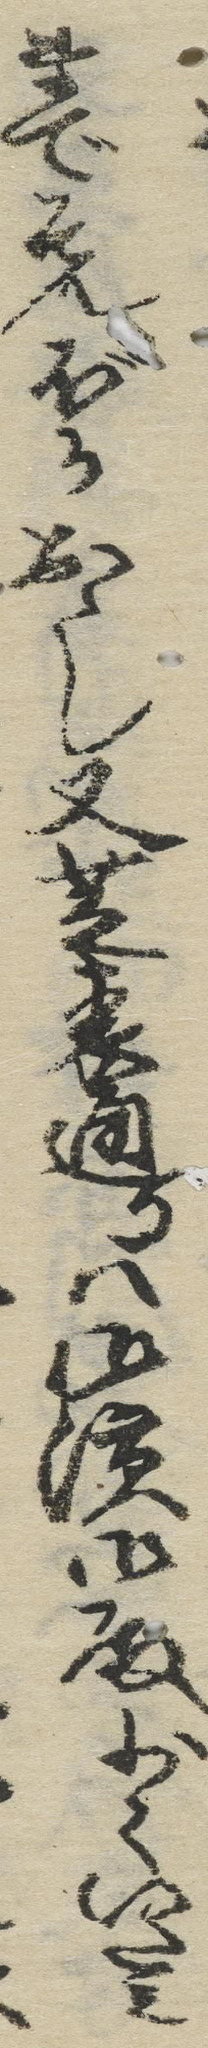までそんぼうおゝし又芝裏通りハ御浜御殿少々いたミ
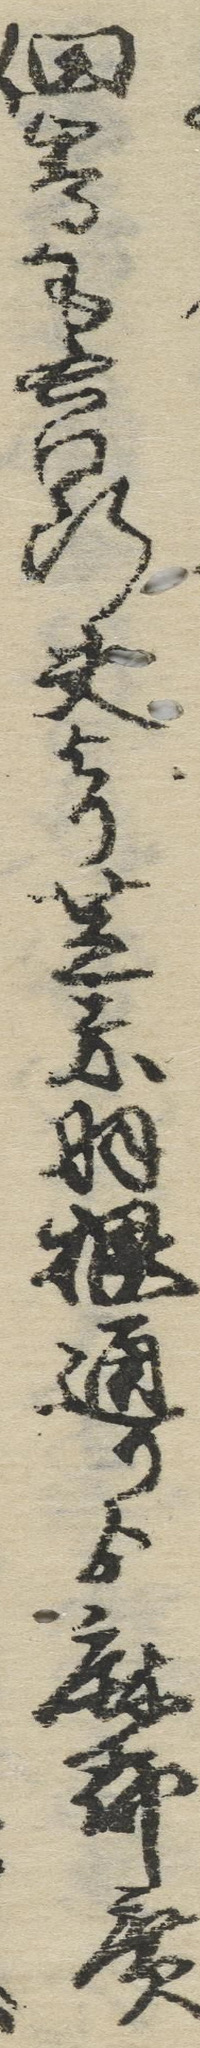佃島も右同断夫より芝赤羽根通りゟ麻布広
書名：御府内五街道　大地しん
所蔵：東京大学地震研究所図書室 Earthquake Research Institute Library, The University of Tokyo, JAPAN
